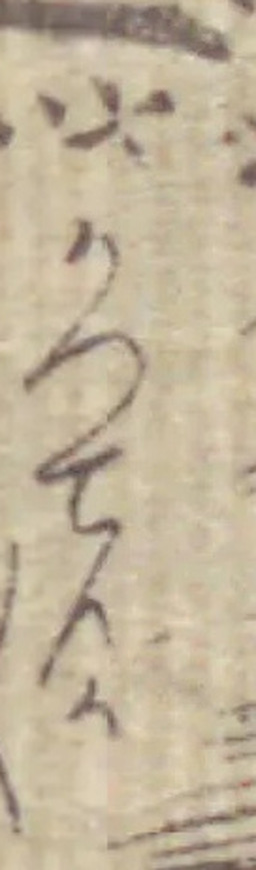かつてんか
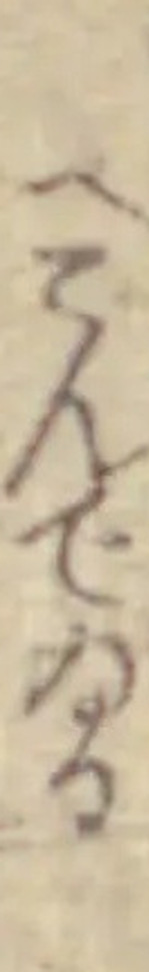へこんでゐる
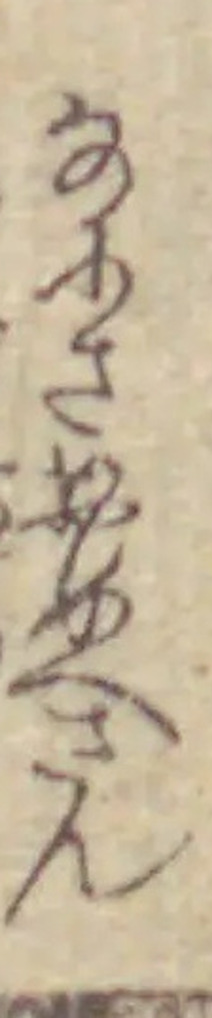なにさおめへさん
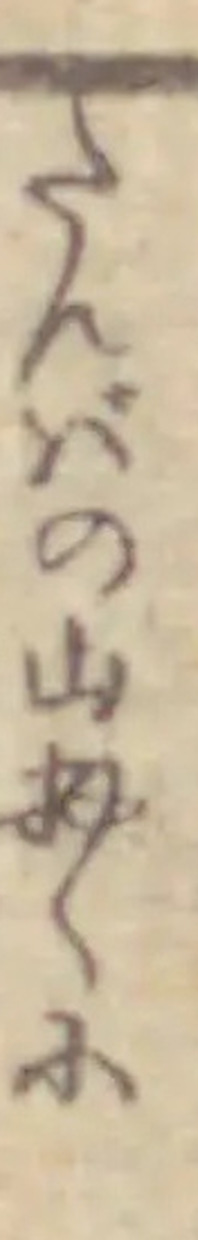たんばの山おくに
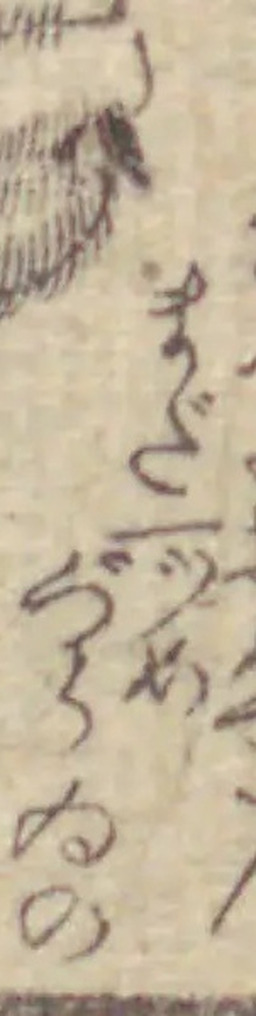ぐらゐの
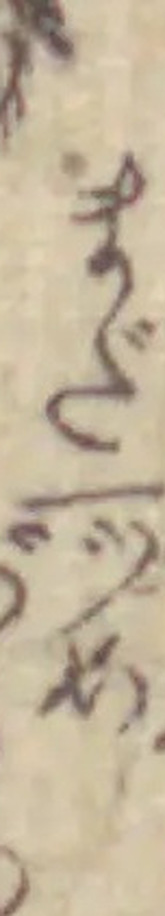まだ一つめ
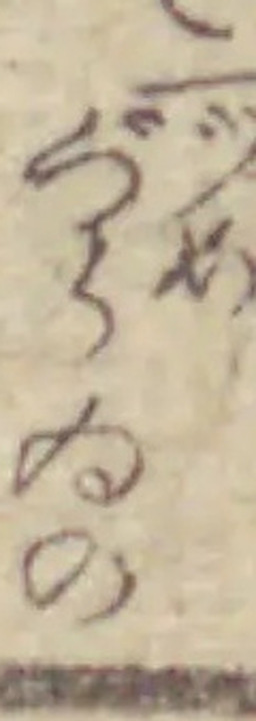ぐらゐの
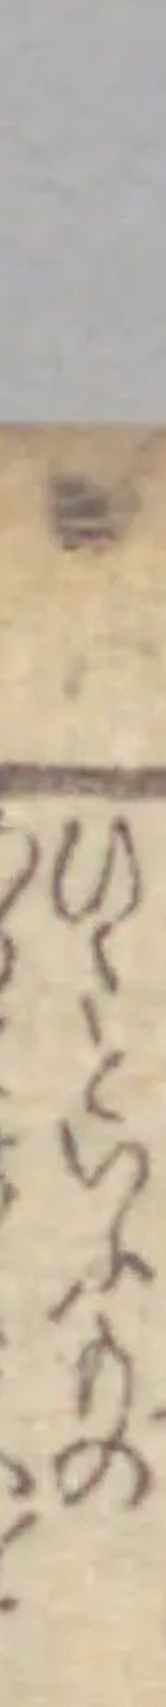ひゝといふもの
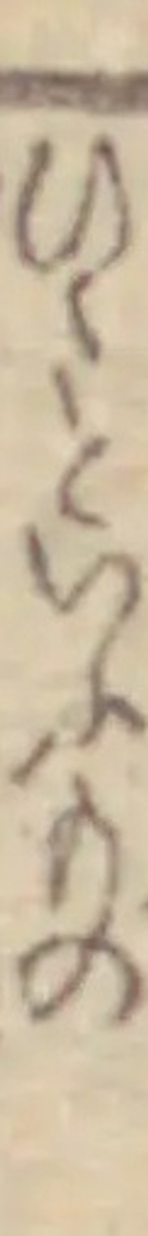ひゝといふもの
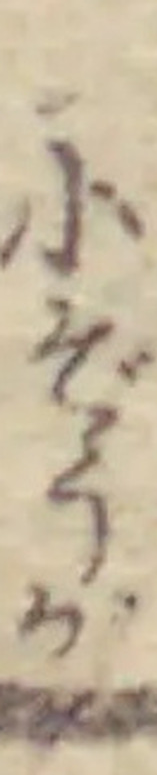小ぞうが
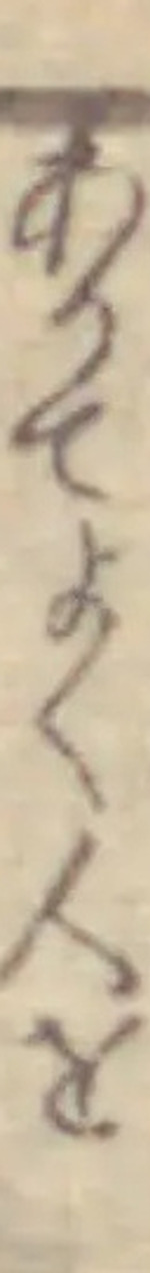ありてよく人を
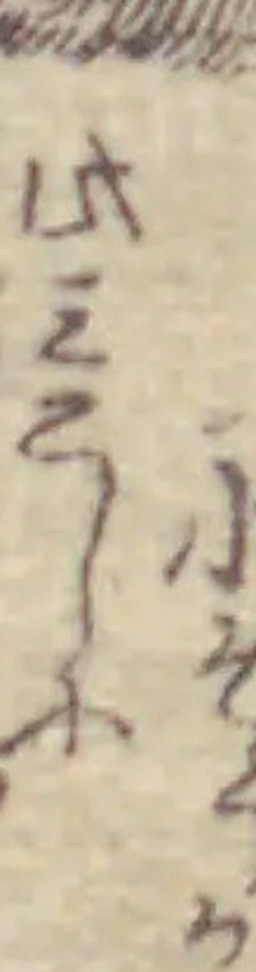此みこしに
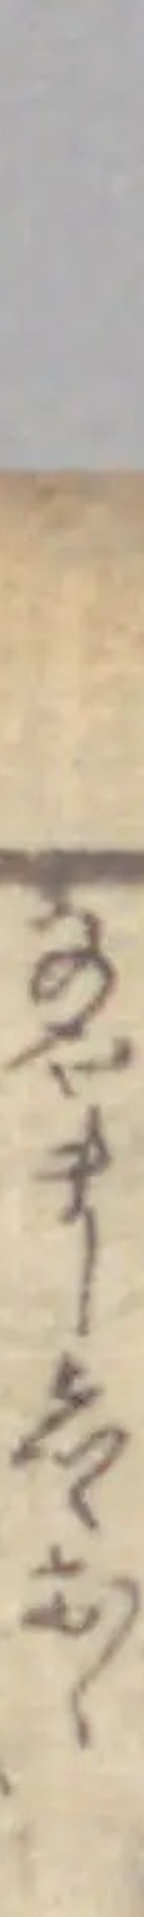なやまししゝおゝ
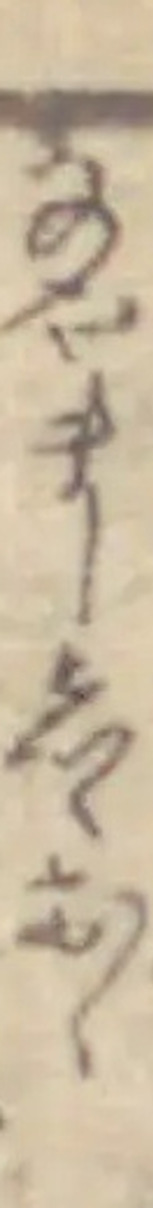なやまししゝおゝ
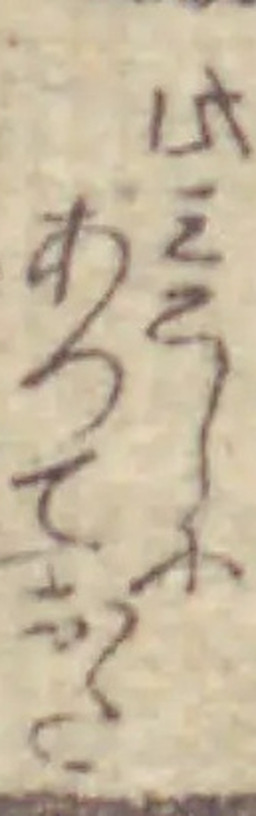あつておた
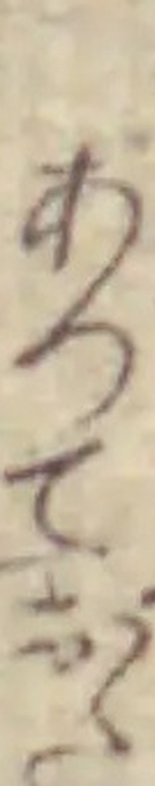あつておた
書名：大昔化物双紙 2巻
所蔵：国立国会図書館 National Diet Library, JAPAN
